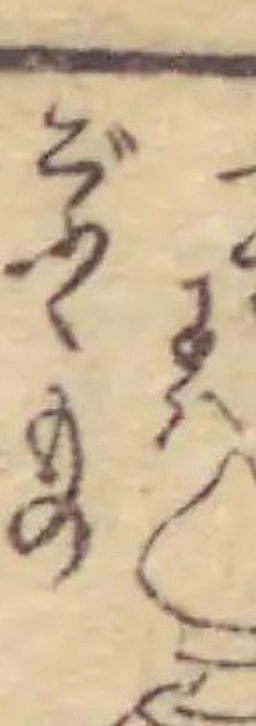ごふくもの
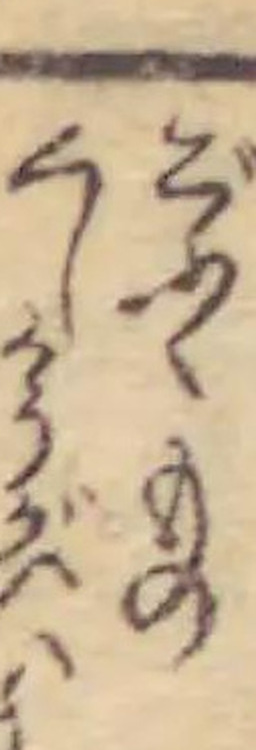くしかうがいは
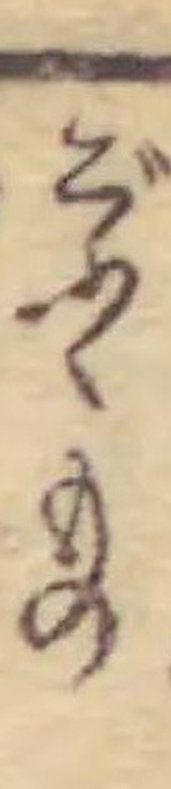ごふくもの
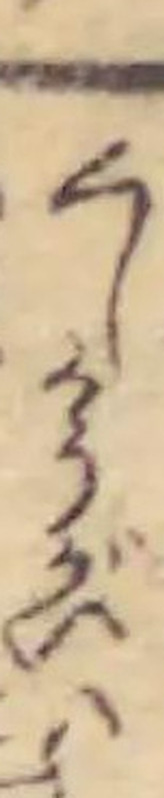くしかうがいは
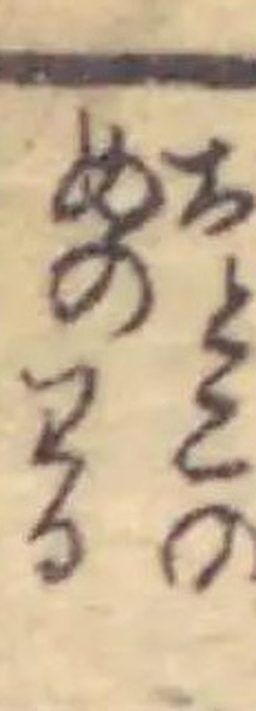めのわる
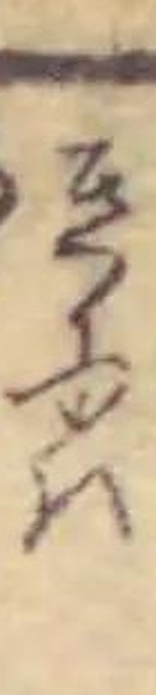きには
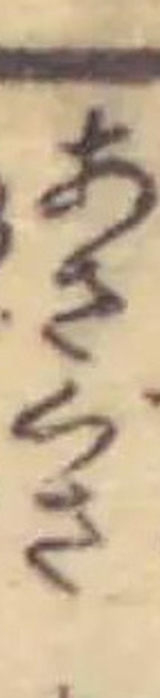あさくさ
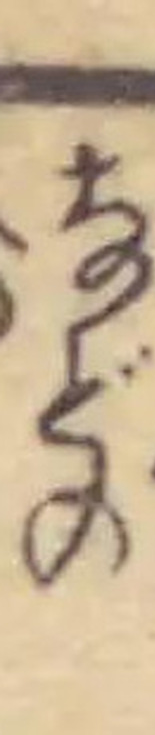などの
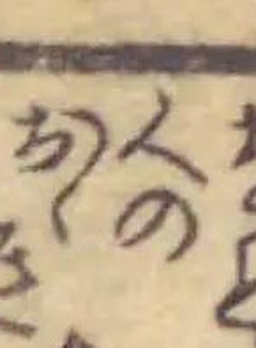おゝき
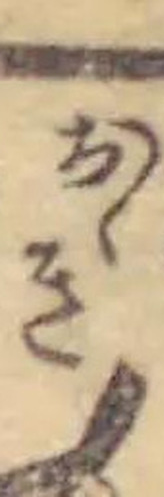おゝき
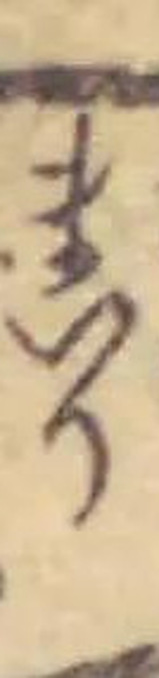まいり
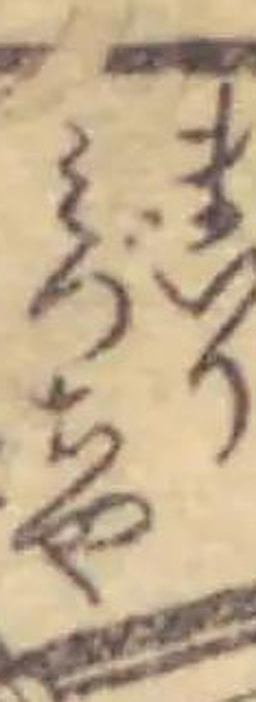みづちや
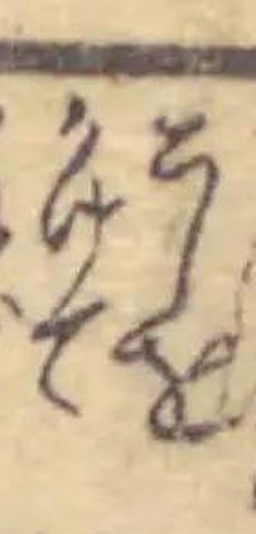かけて
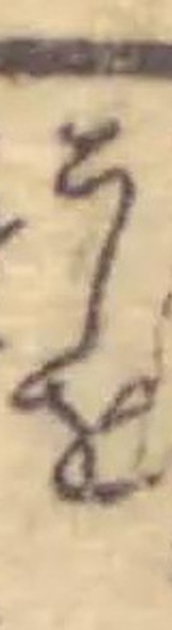こしを
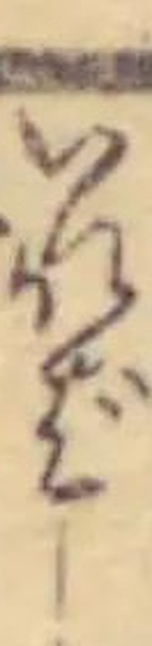いれば
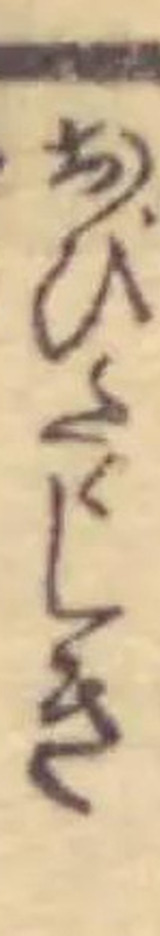おびたゝしき
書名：家伝寿命薬 2巻
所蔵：国立国会図書館 National Diet Library, JAPAN
